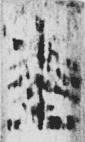○（舜）
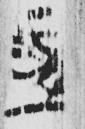聖（聽）
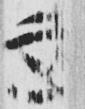正（政）
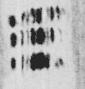三
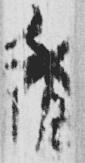年
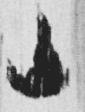山
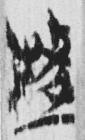陵
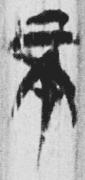不
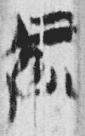凥（疏）
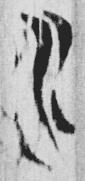水
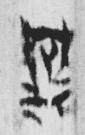滎（潦）
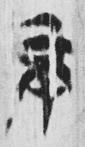不
